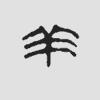羊
